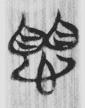{䀠心}
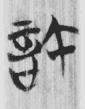許
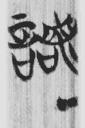諾
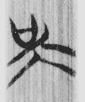吳
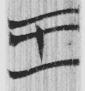王
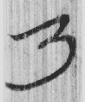乃
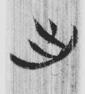出
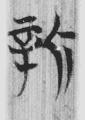{辛斤}
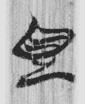見
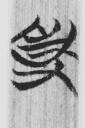事
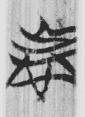者
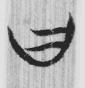曰
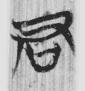君
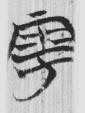𩁹
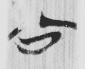公
